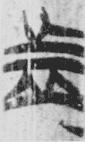者
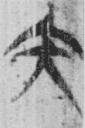內（墜）
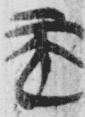而
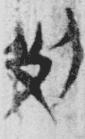死
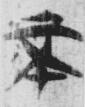不
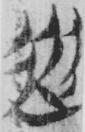從
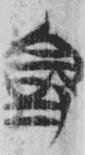命
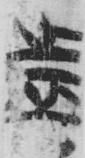者
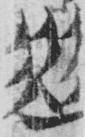從
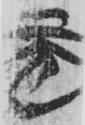而
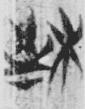桎
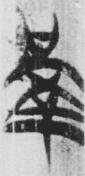○（梏）
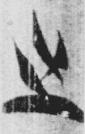之
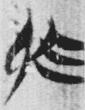於
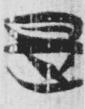是
